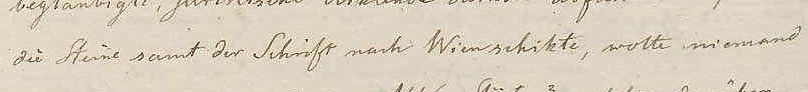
die Steine samt der Schrift nach Wien schikte, wolte niemand
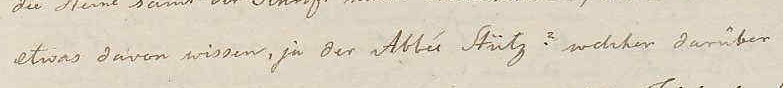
etwas davon wissen, ja der Abbée Stütz ? welcher darüber
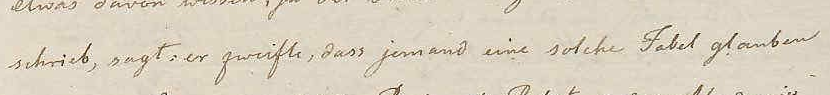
schrieb, sagt: er zweifle, dass jemand eine solche Fabel glauben
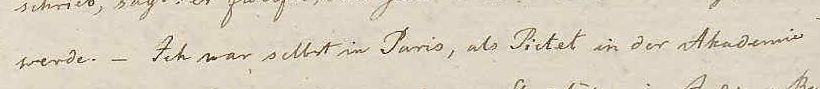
werde. – Ich war selbst in Paris, als Pictet in der Akademie
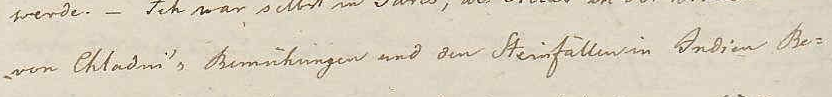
von Chladni's Bemühungen und den Steinfällen in Indien Be-
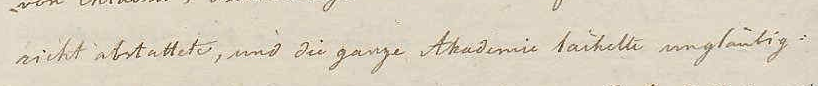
richt abstattete, und die ganze Akademie lächelte ungläubig:
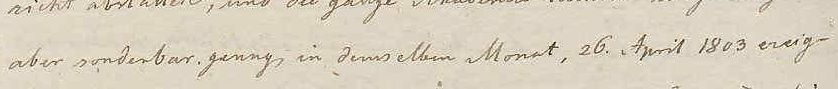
aber sonderbar genug, in demselben Monat, 26. April 1803 ereig-
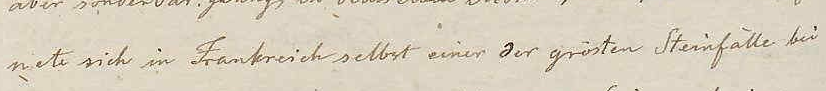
nete sich in Frankreich selbst einer der grösten Steinfälle bei
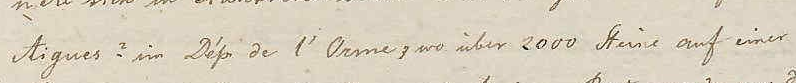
Aigues ? im Dép. de l'Orme:, wo über 2000 Steine auf einer
